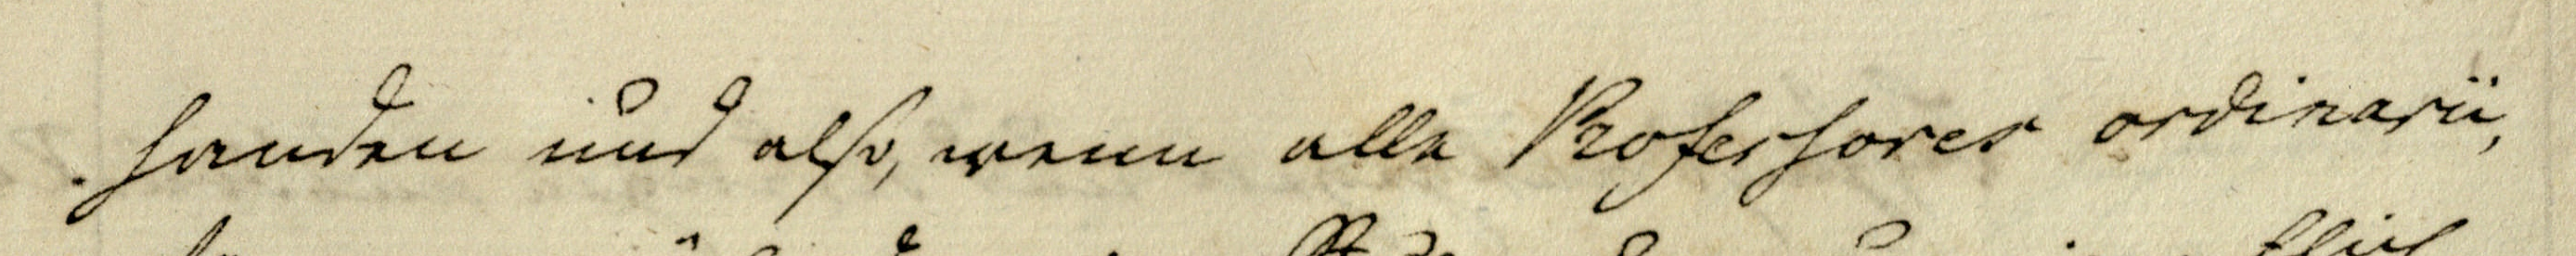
handen und also, wenn alle Professores ordinarii,
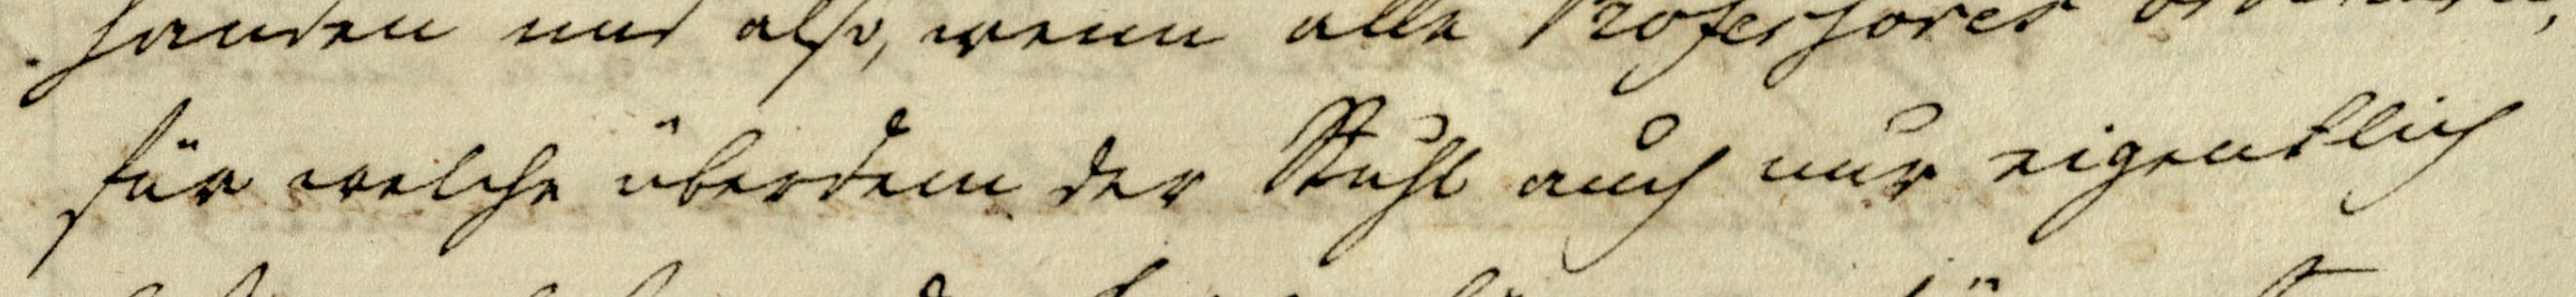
für welche überdem der Stuhl auch nur eigentlich
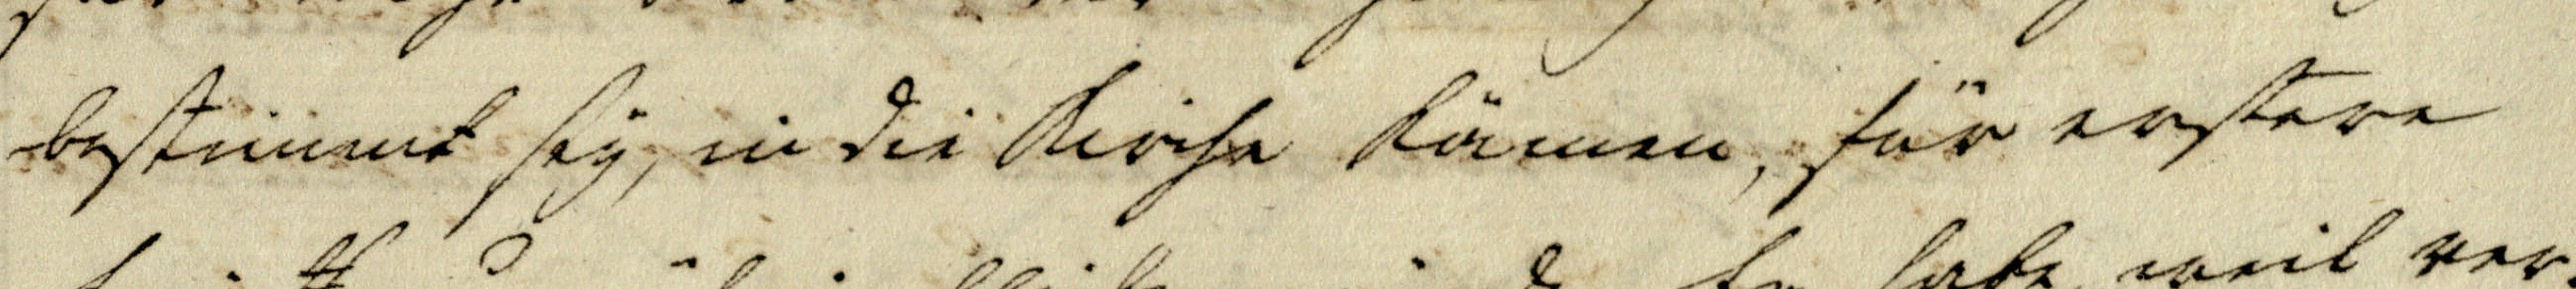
bestimmt seÿ, in die Kirche kämen, für erstere
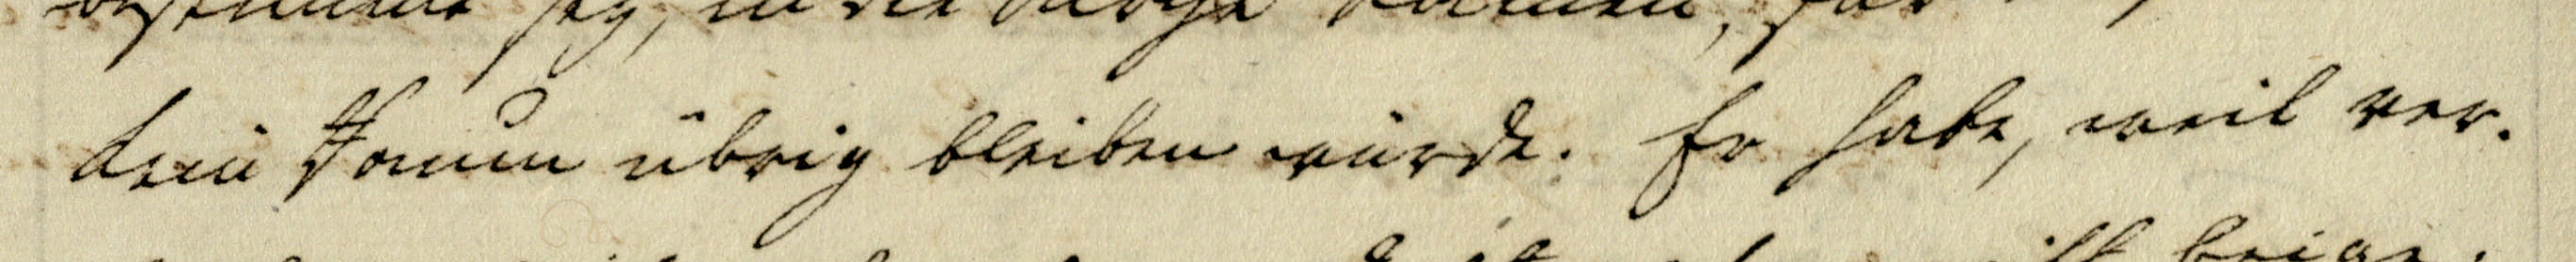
kein Raum übrig bleiben würde. Er habe, weil ver¬
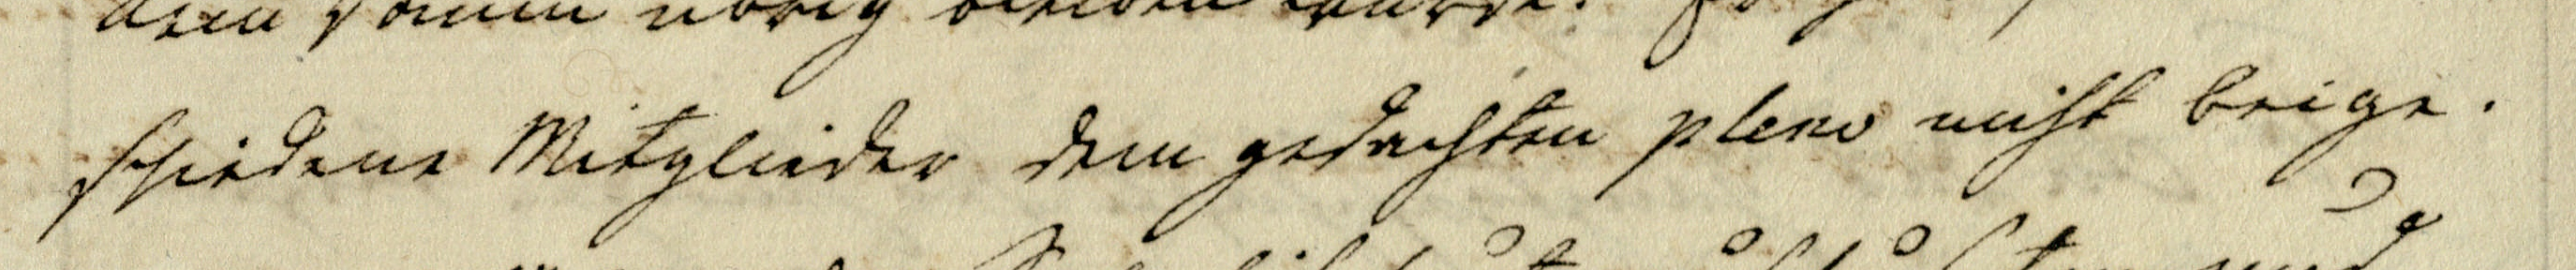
schiedene Mitglieder dem gedachten pleno nicht beige¬
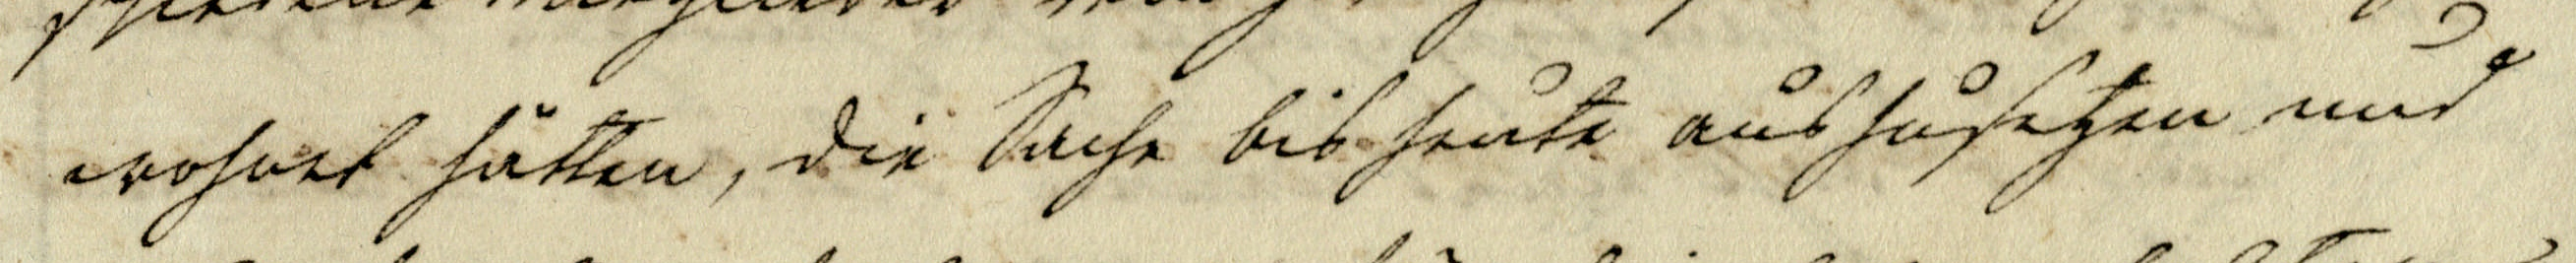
wohnet hätten, die Sache bis heute auszusetzen und
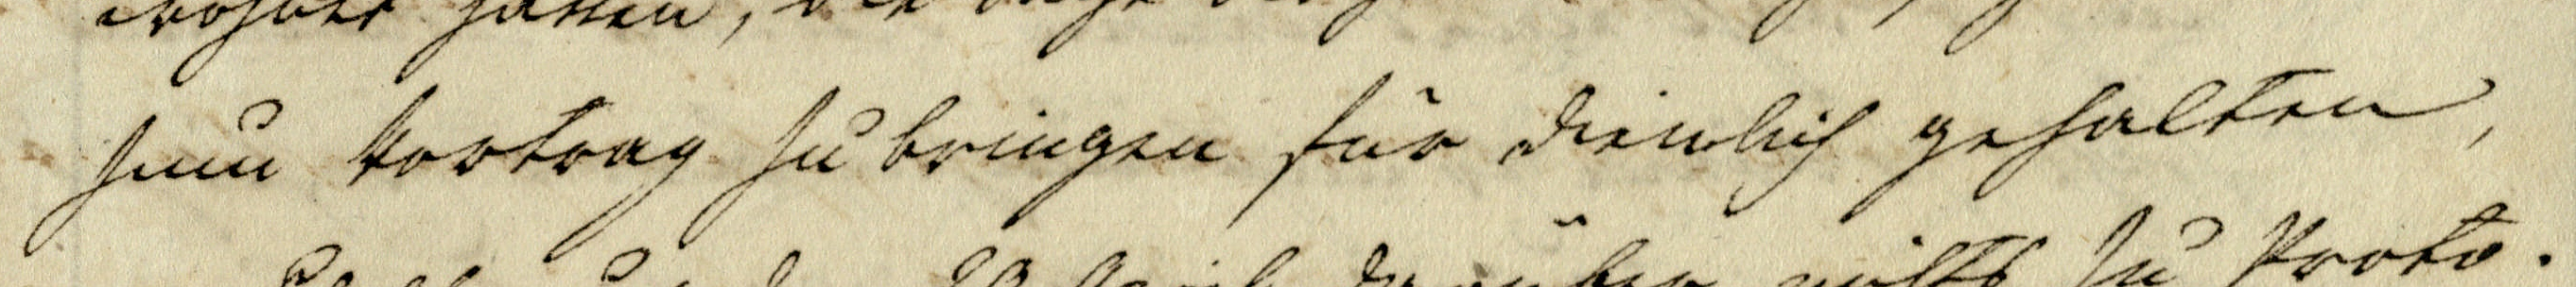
zum Vortrag zu bringen für dienlich gehalten,
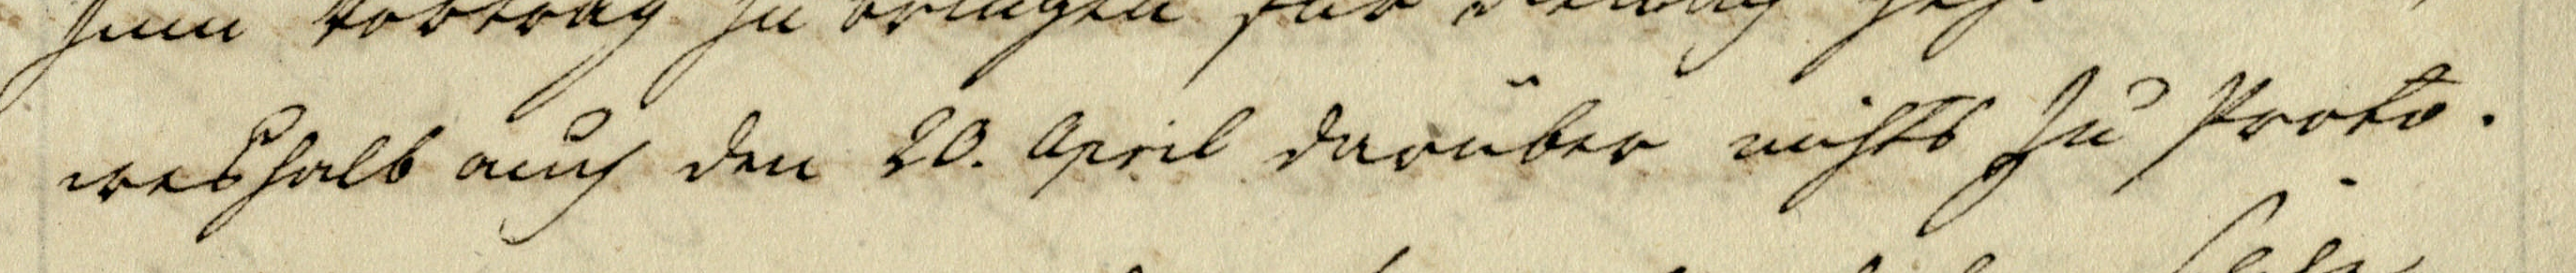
weshalb auch den 20. April darüber nichts zu Proto¬
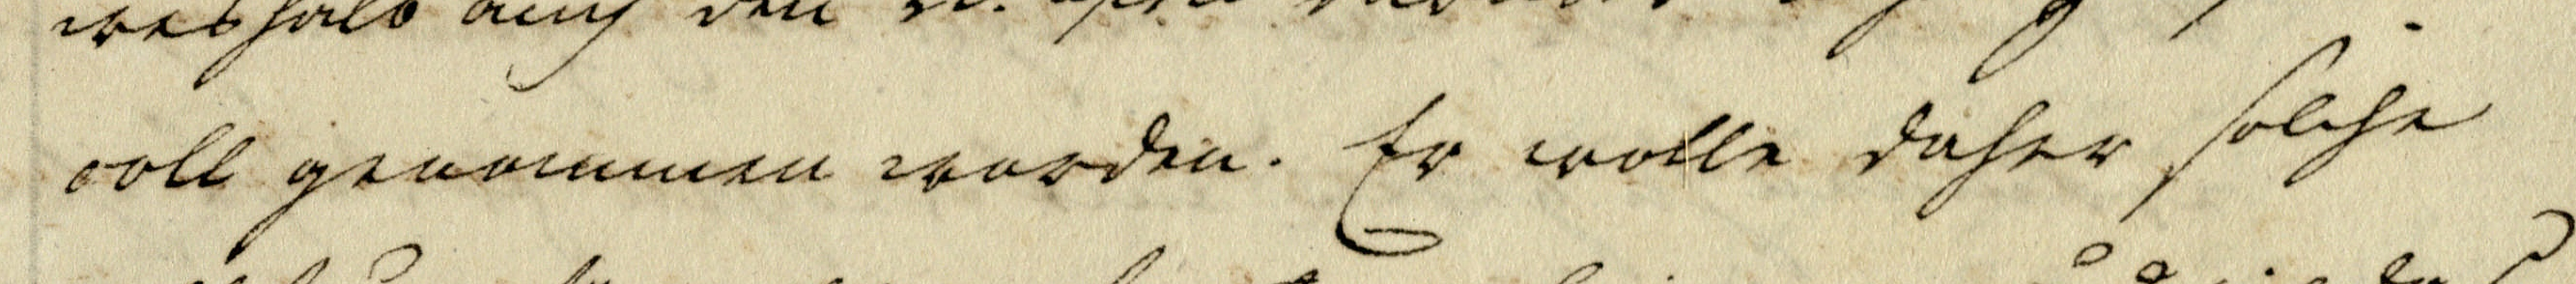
coll genommen worden. Er wolle daher solche
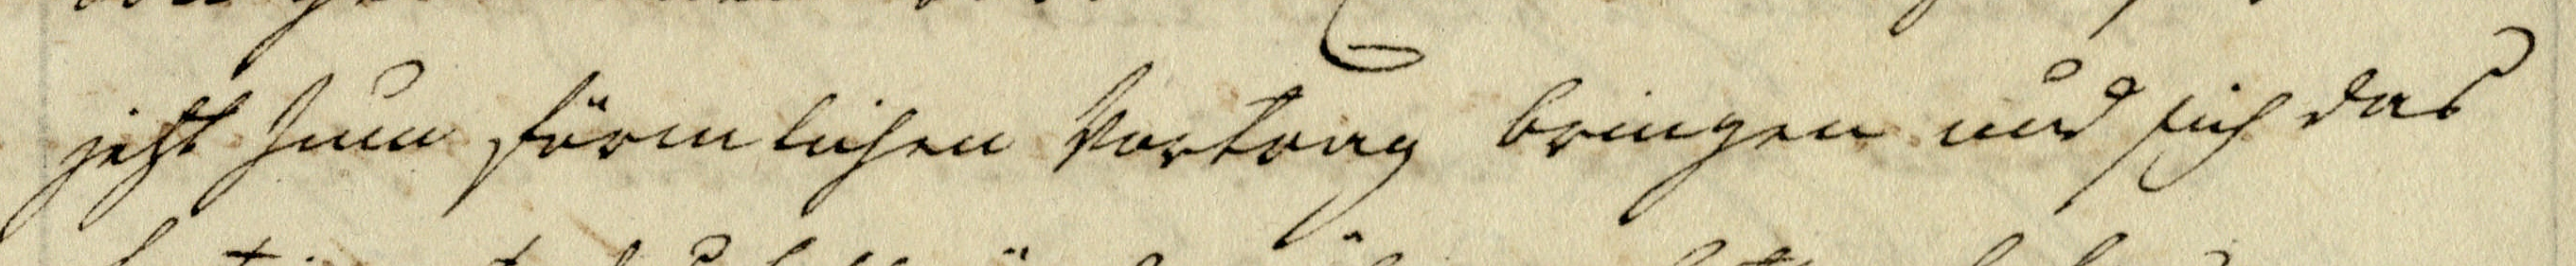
jetzt zum förmlichen Vortrag bringen und sich das
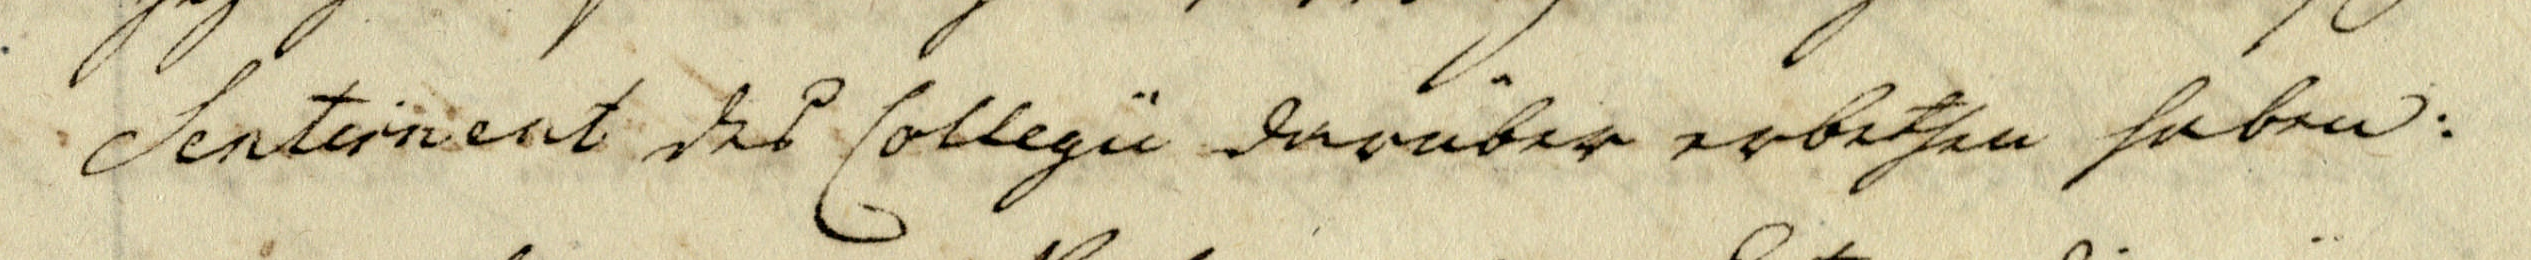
Sentiment des Collegii darüber erbethen haben:
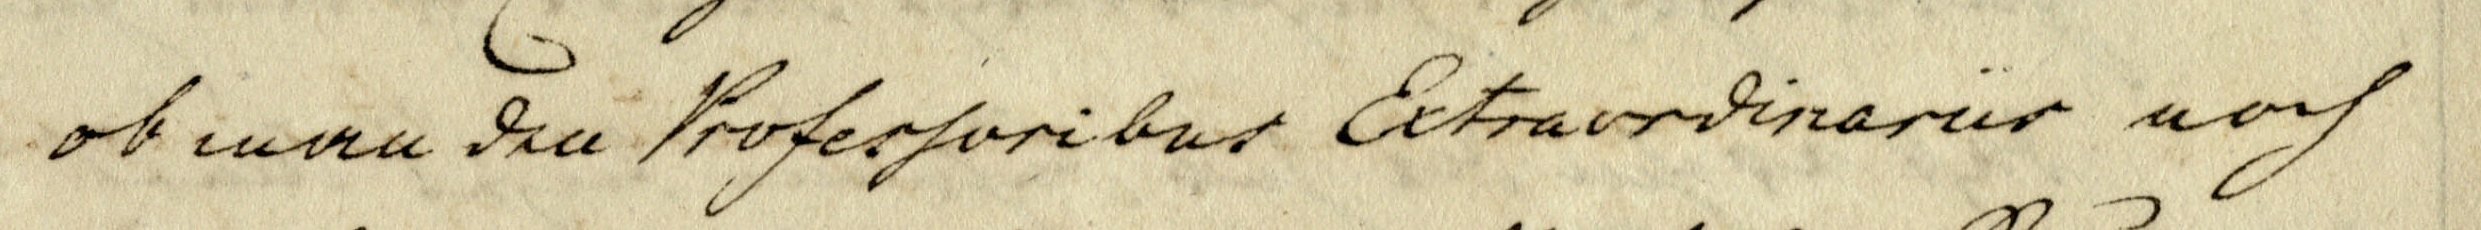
ob man den Professoribus Extraordinaruis noch
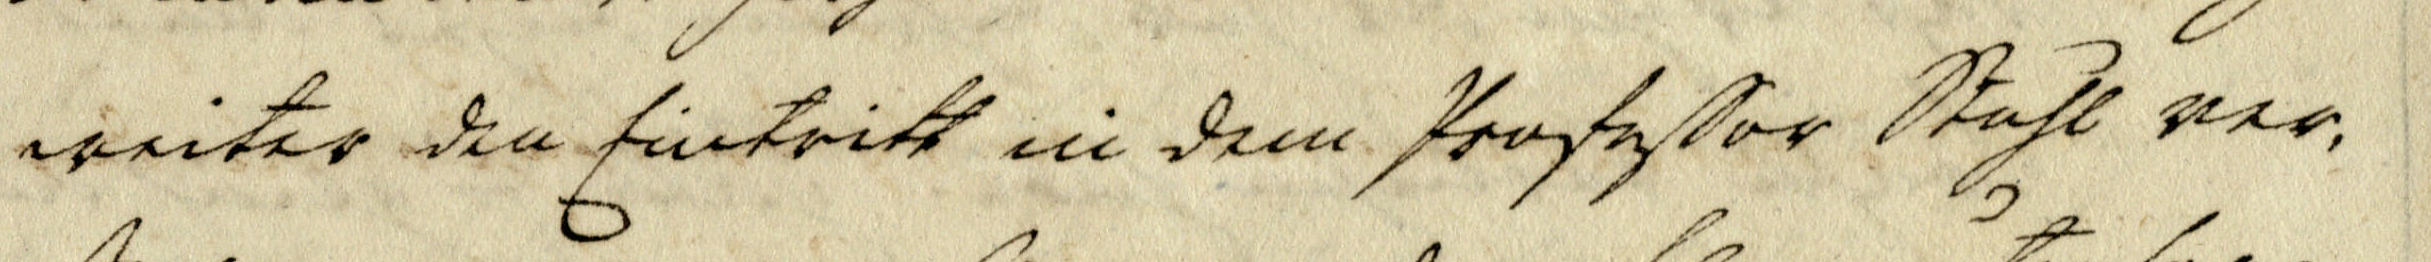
weiter den Eintritt in dem Professor Stuhl ver¬
